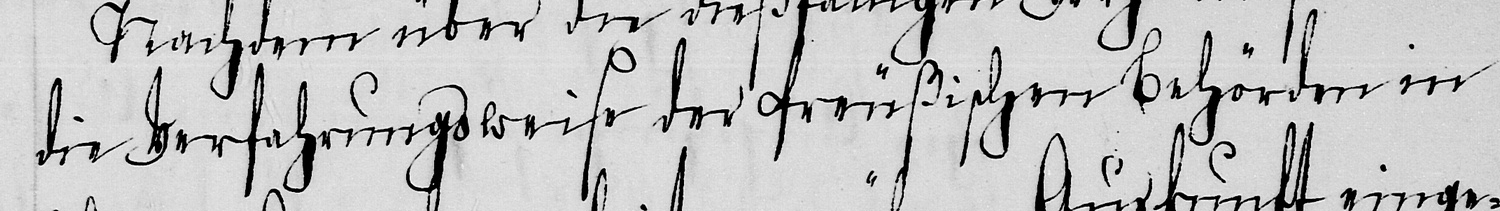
die Verfahrungsweise der Preußischen Behörden in
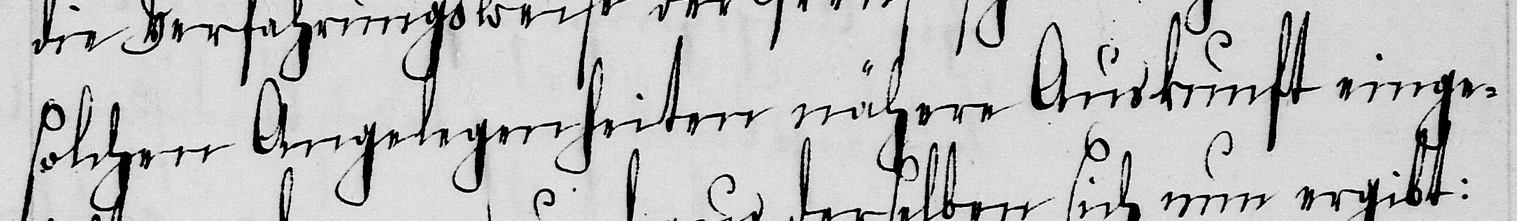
solchen Angelegenheiten nähere Auskunft einge¬
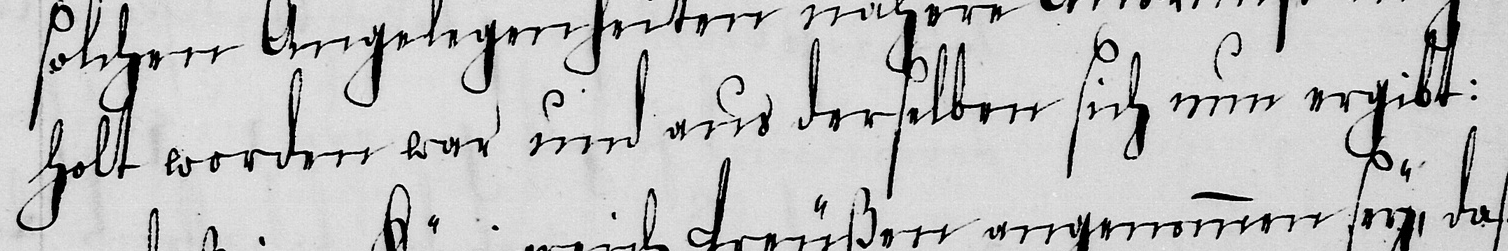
holt worden war und aus derselben sich nun ergibt:
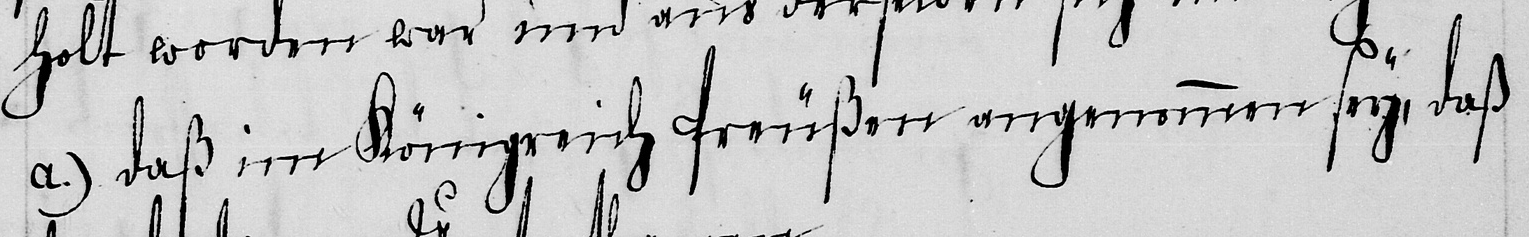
a.) daß im Königreich Preußen angenommen sey, daß
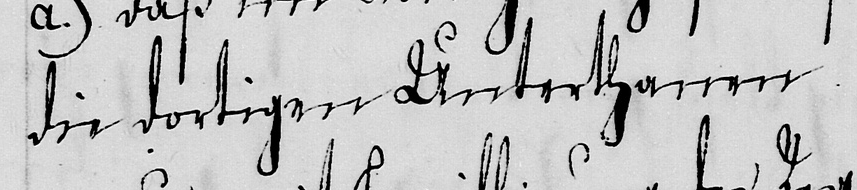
die dortigen Unterthanen
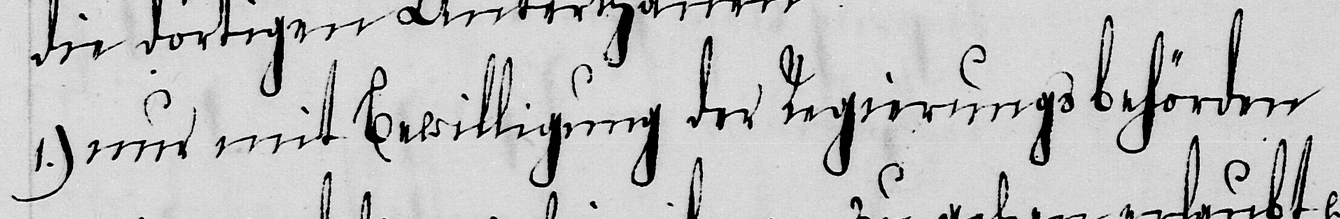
1.) nur mit Bewilligung der Regierungsbehörden
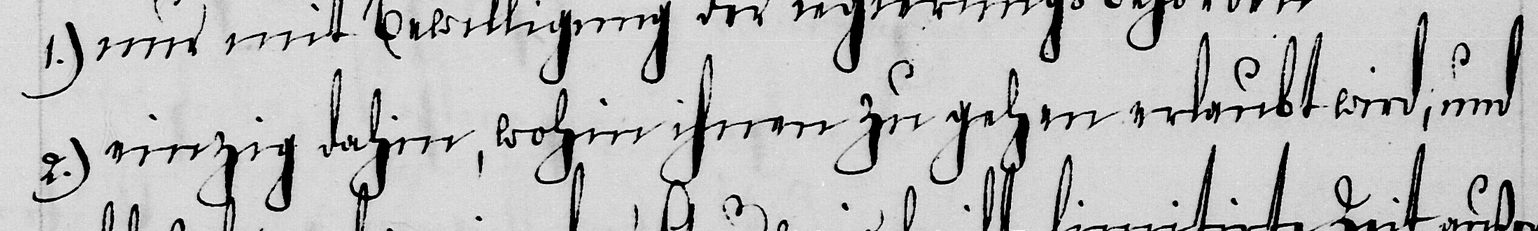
2.) einzig dahin, wohin ihnen zu gehen erlaubt wird, und
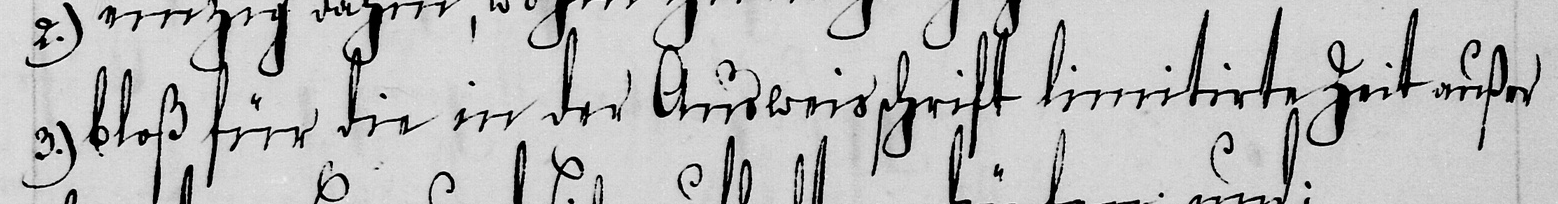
bloß für die in der Ausweisschrift limitirte Zeit außer
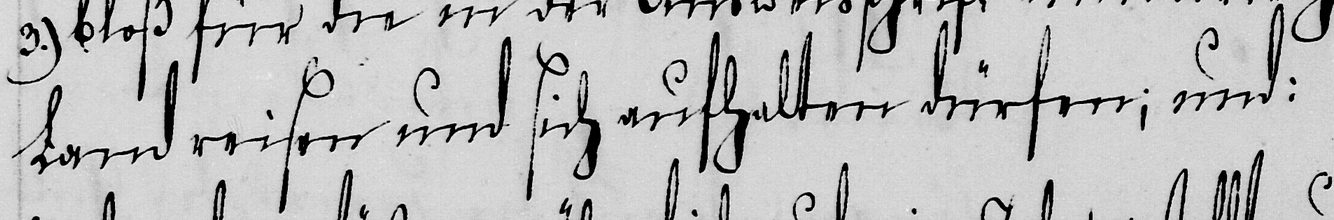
Land reisen und sich aufhalten dürfen; und:
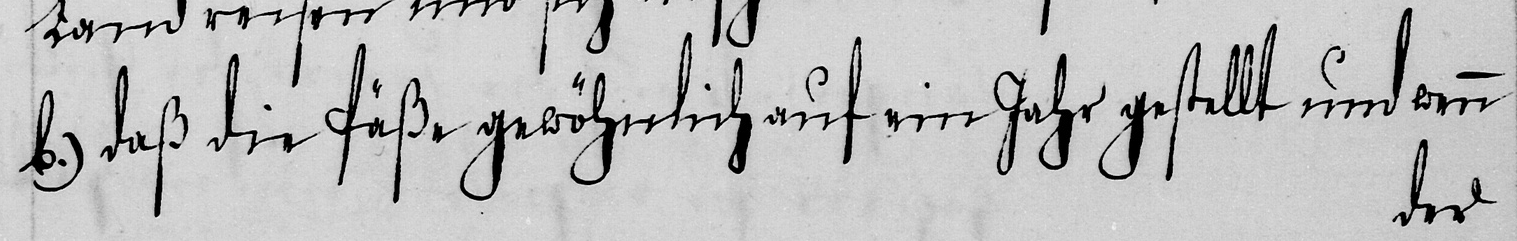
b.) daß die Päße gewöhnlich auf ein Jahr gestellt und
